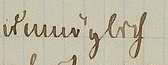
es unmöglich
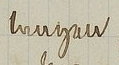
wagen,
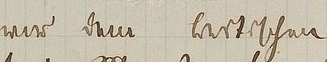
vor dem kritischen
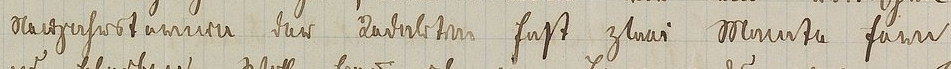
Neujahrstermin der Redaktion fast zwei Monate fern
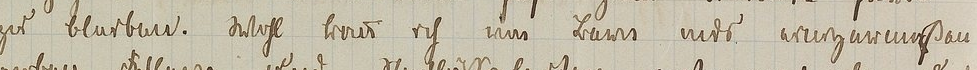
zu bleiben. Wohl kann ich von Bern aus einigermaßen
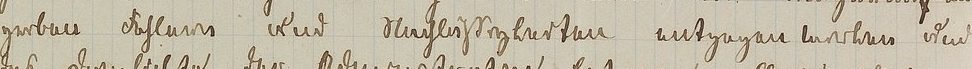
groben Fehlern und Nachläßigkeiten entgegenwirken und
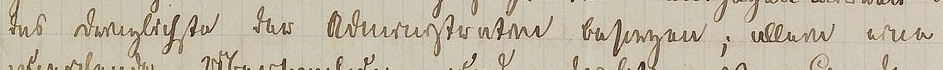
das Dringlichste der Administration besorgen; allein eine
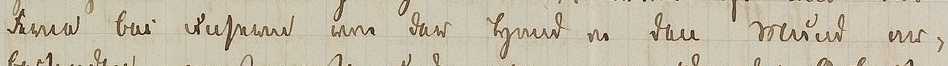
Ferne bei unserm von der Hand in den Mund ar-
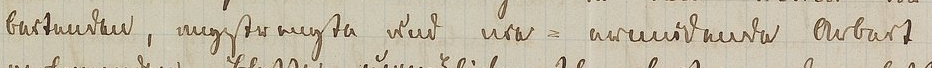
beitenden, angestrengte und nie-ermüdende Arbeit
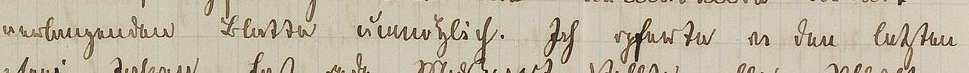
verlangenden Blatte unmöglich. Ich opferte in den letzten
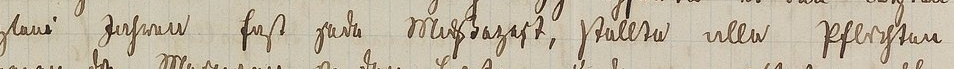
zwei Jahren fast jede Mußezeit, stellte alle Pflichten
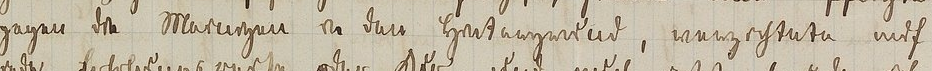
gegen die Meinigen in den Hintergrund, verzichtete auf
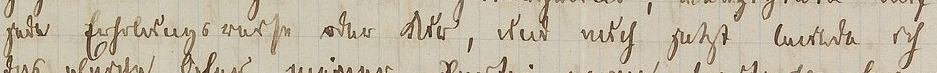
jede Erholungsweise oder Kur, und auch jetzt würde ich
